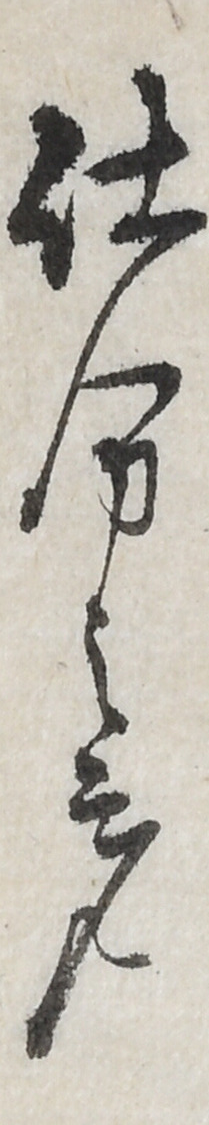仕分之覚
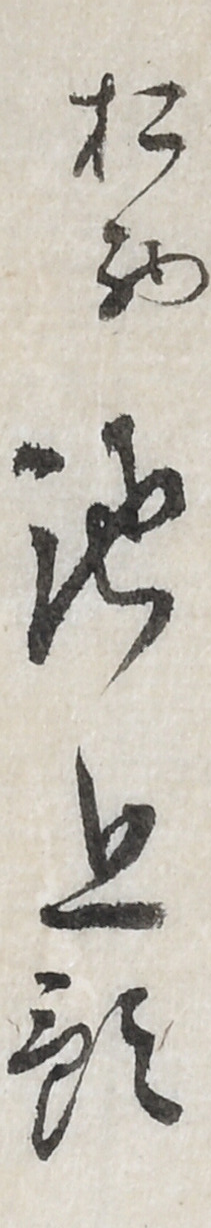於西池上預
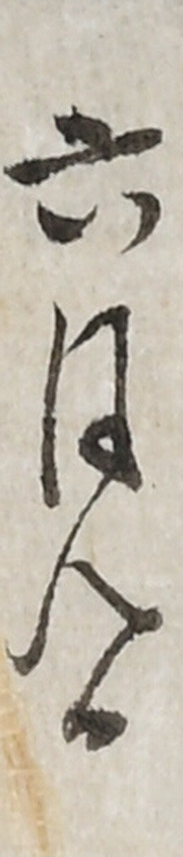六月八日
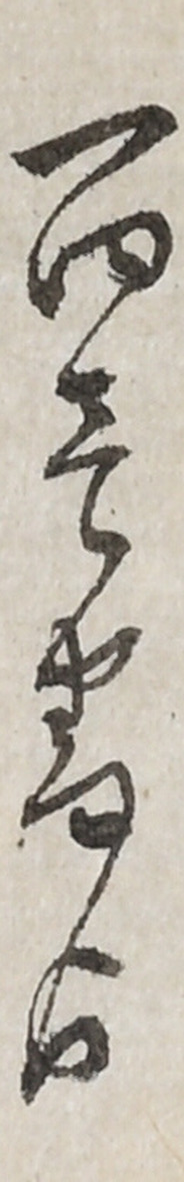百壱番ゟ
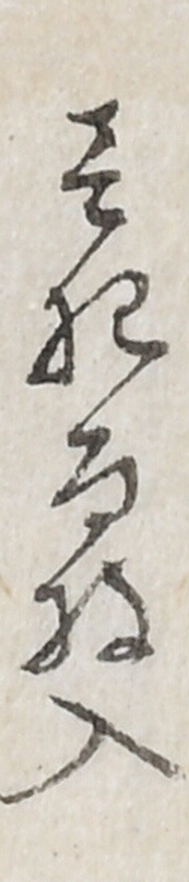壱把百枚入
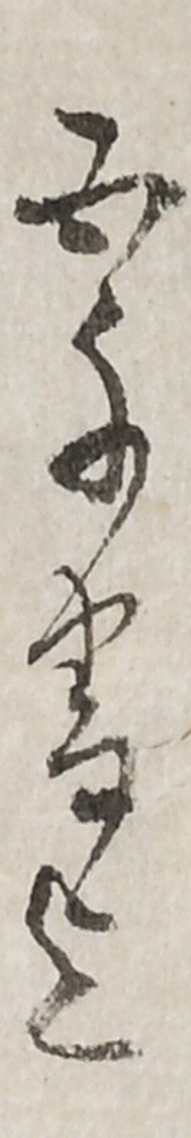五千番迄
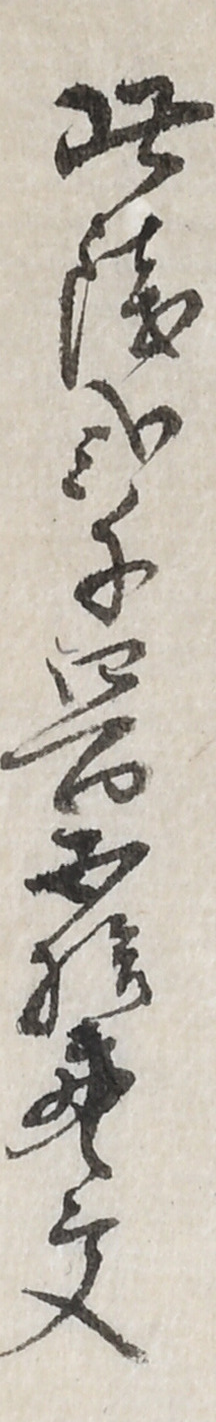此銭弐千四百五拾貫文
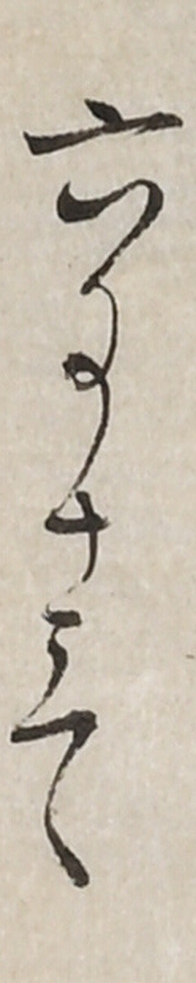六月十三日
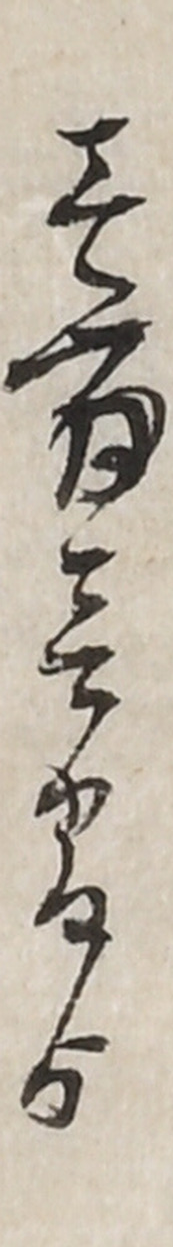壱百壱番ゟ
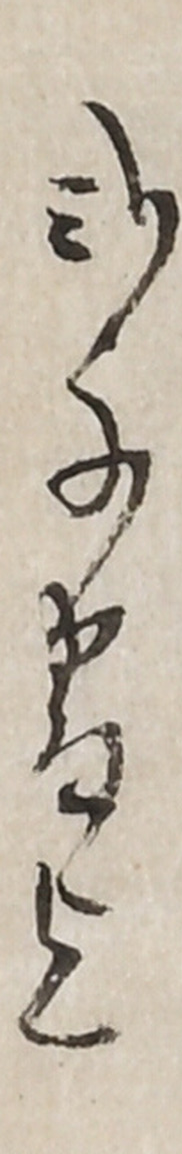弐千番迄
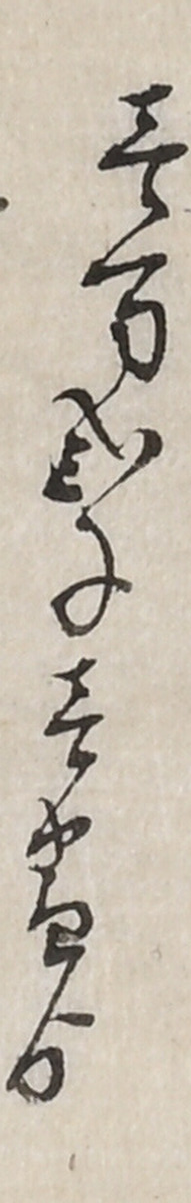壱万弐千壱番ゟ
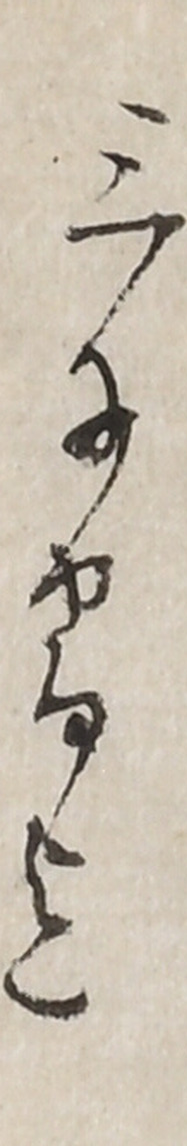三千番迄
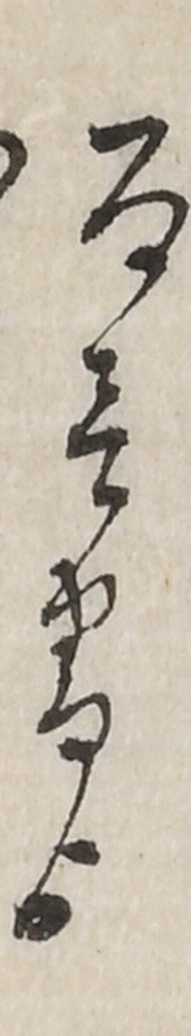百壱番ゟ
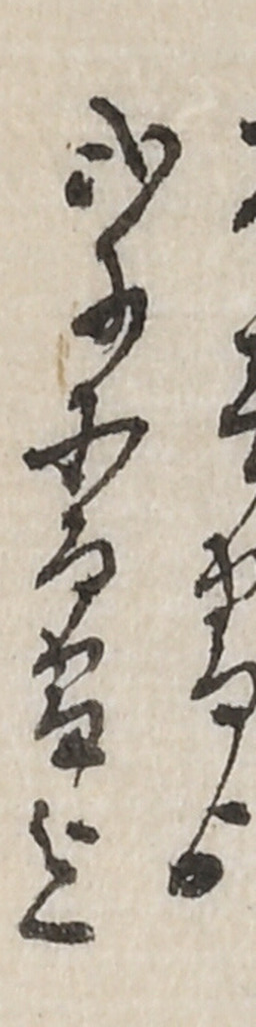弐千五百番迄
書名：髙遠限楮幣引換ニ付御下ケ渡控
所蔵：伊那市立高遠町図書館・合同会社AMANE
